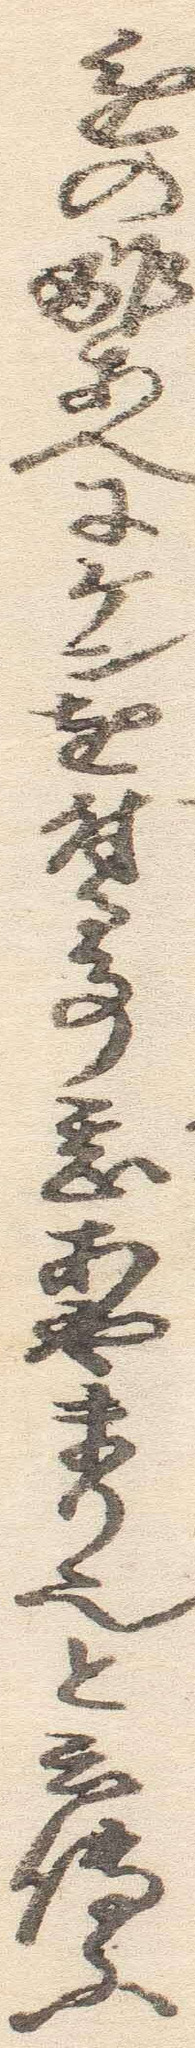進の酢あへにケンを付る事甚あやまり也と云伝ふ
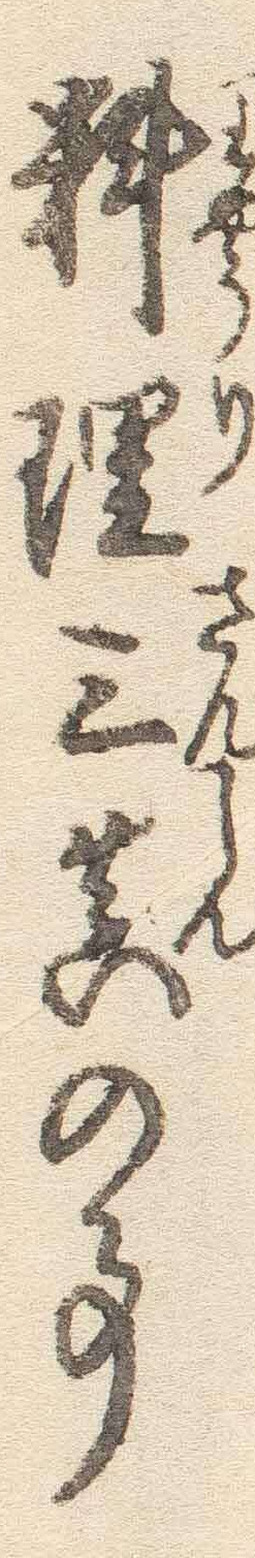料理三真の事
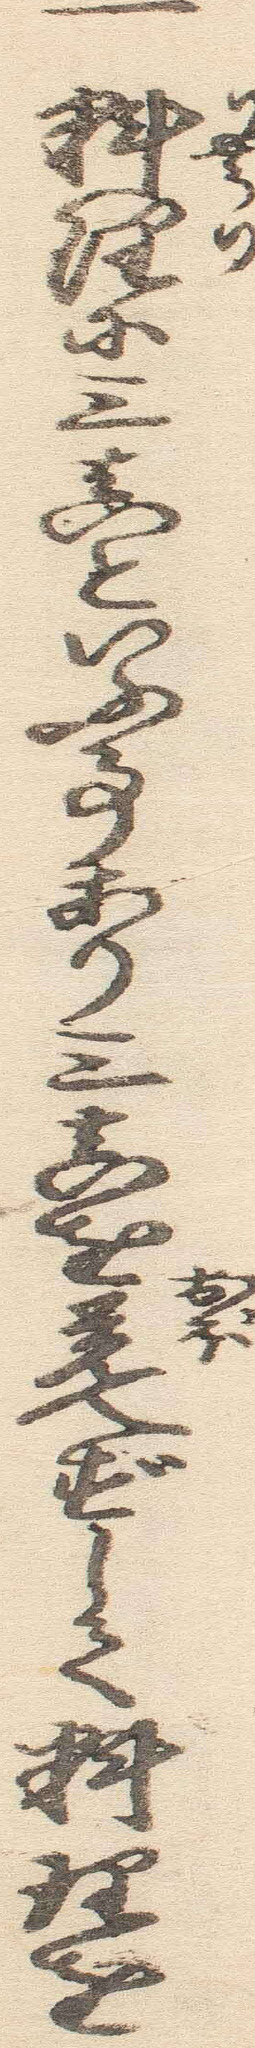一料理に三真といふ事あり三真を覚へずして料理を
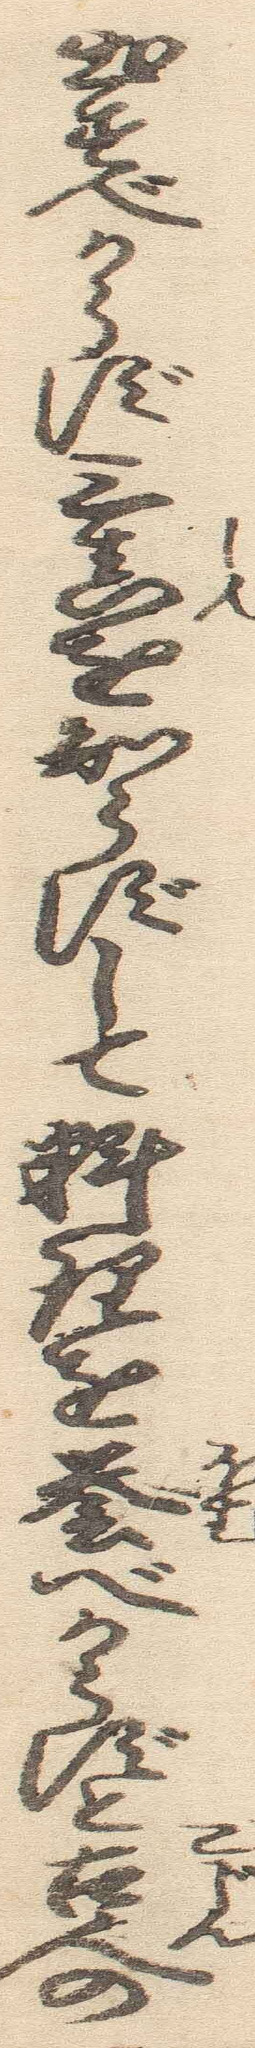出すべからず三真を知らずして料理を誉むべからずと古人の

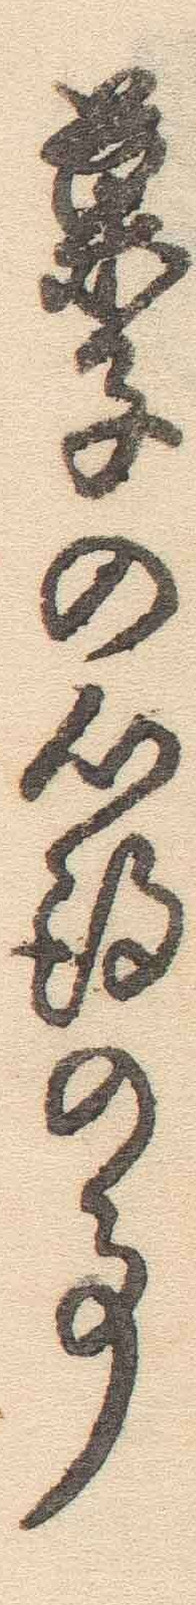菓子の心得の事
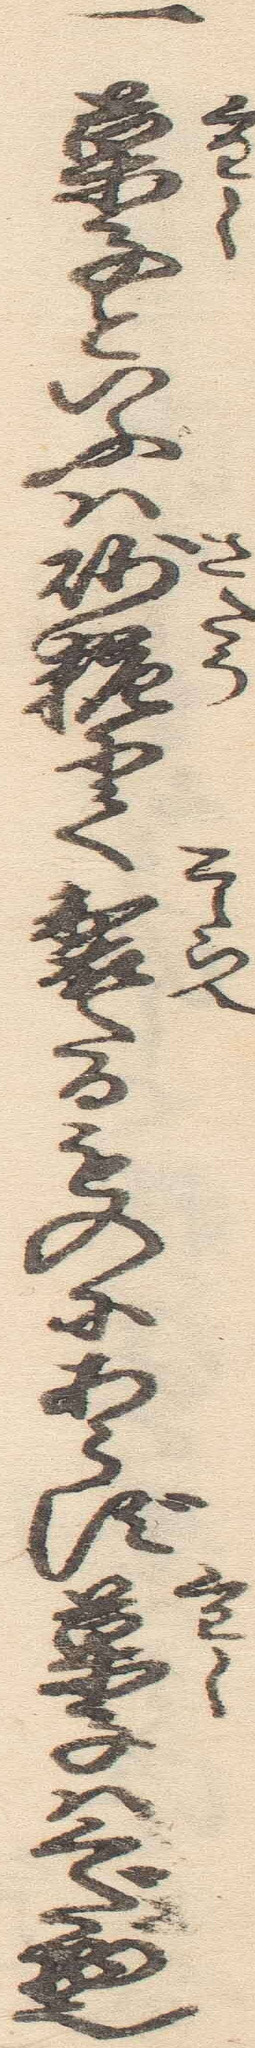一菓子といふは砂糖にて製たるものにあらず菓子はくだ物也
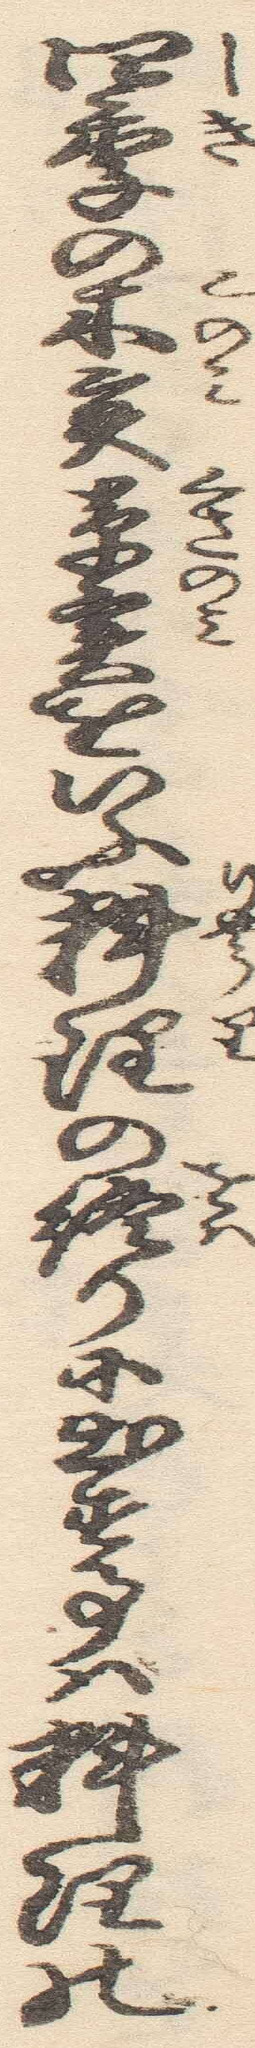四季の木実草実をいふ料理の終りに出す事は料理の
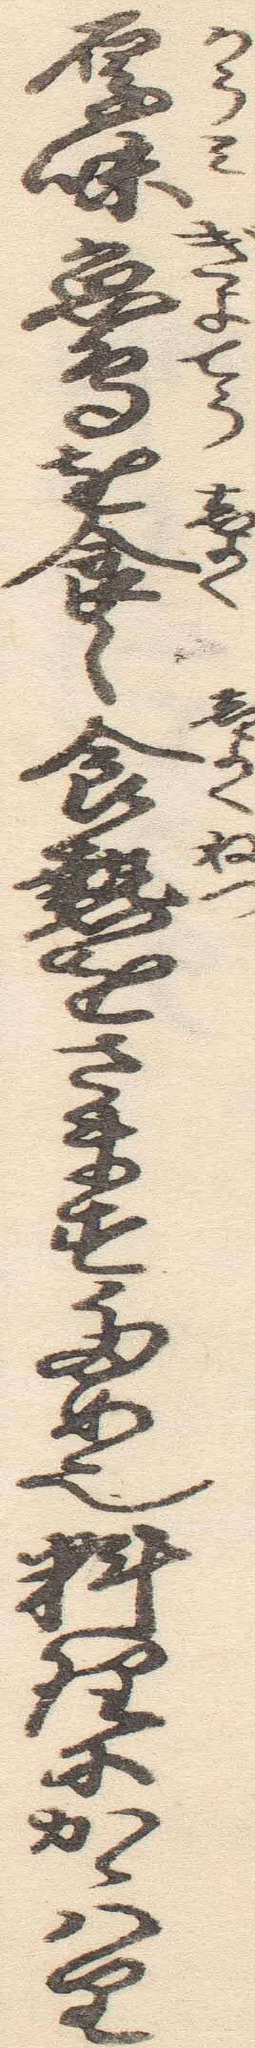厚味魚鳥を食し食熱をさますため也料理にかゝはり
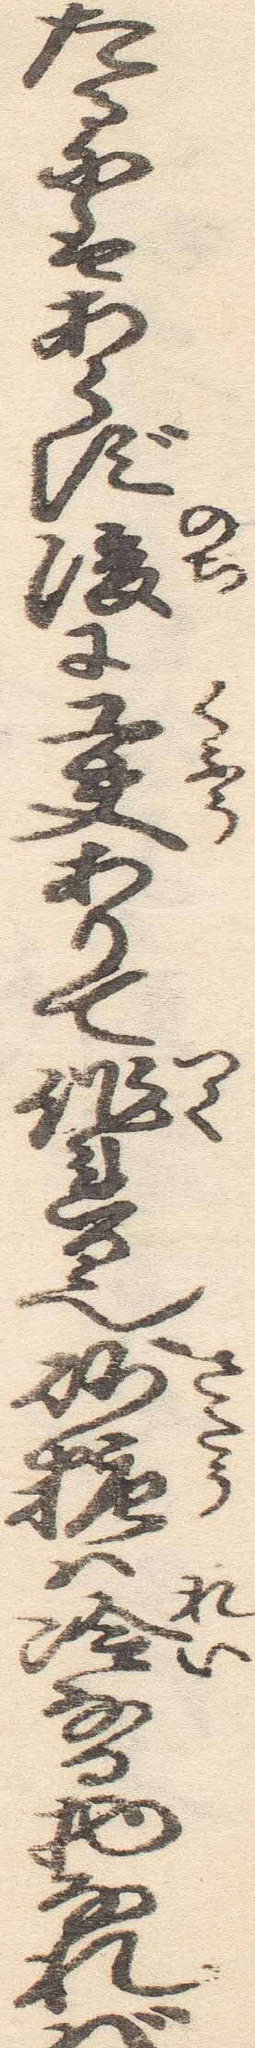たるにはあらず後に工夫ありて作れる也砂糖は冷なる物なれば
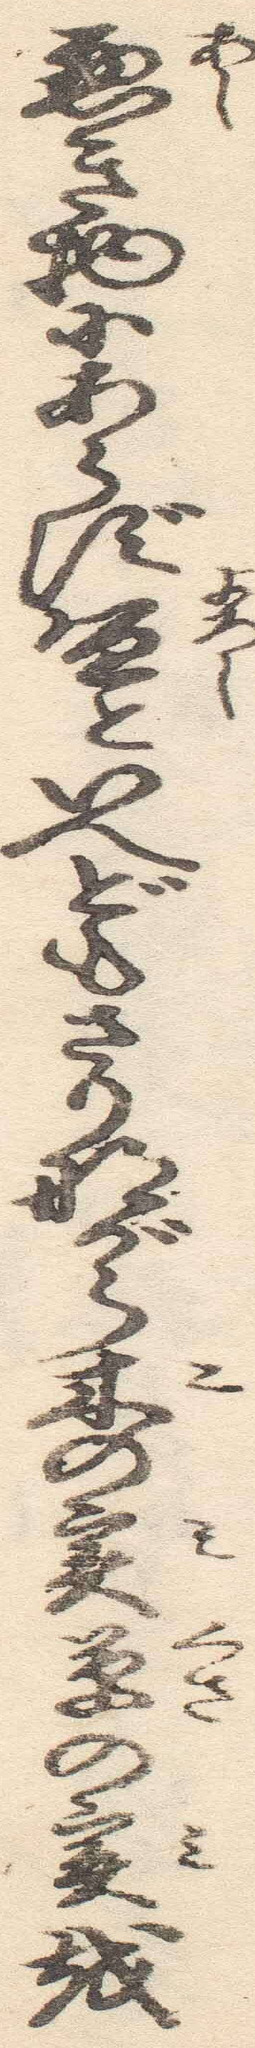悪き物にあらず宜しといへどもさりながら木の実草の実を
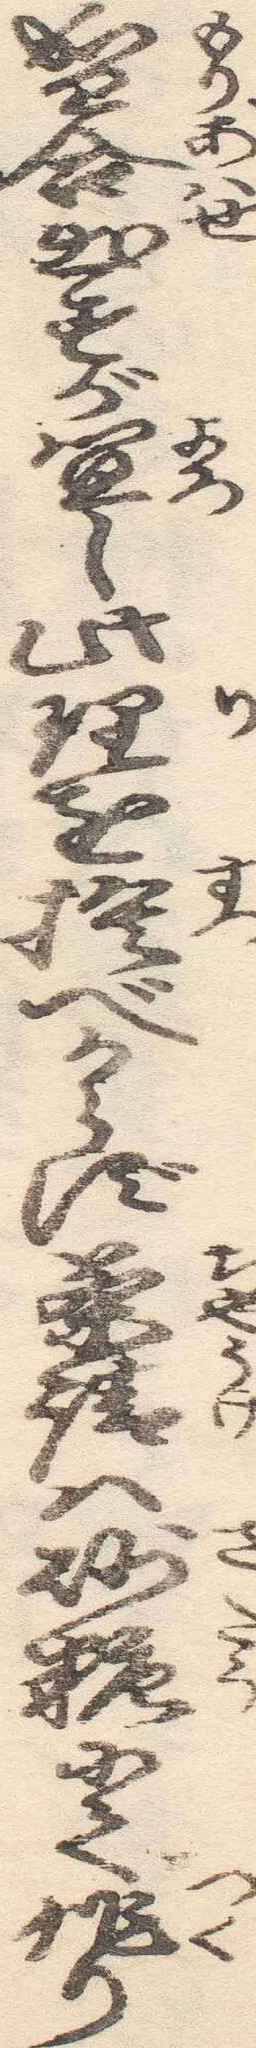盛合出すが宜し此理を捨べからず茶請は砂糖にて作り
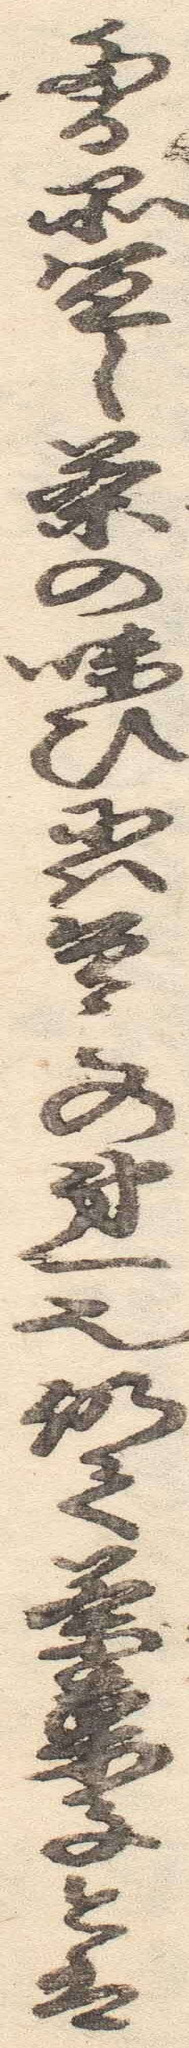たる品宜し茶の味ひには宜もの第一也仍て茶菓子とは
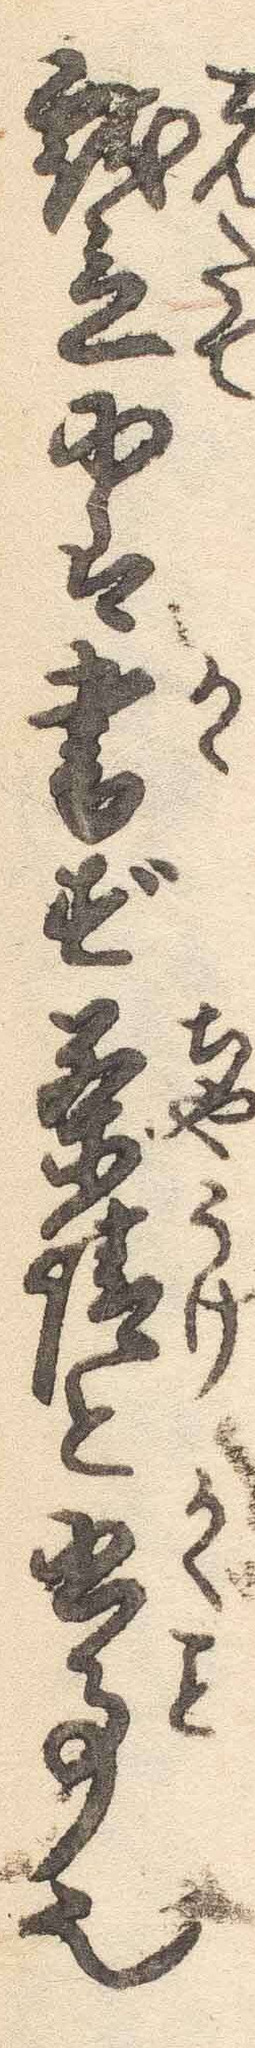献立には書ず茶請と書事也
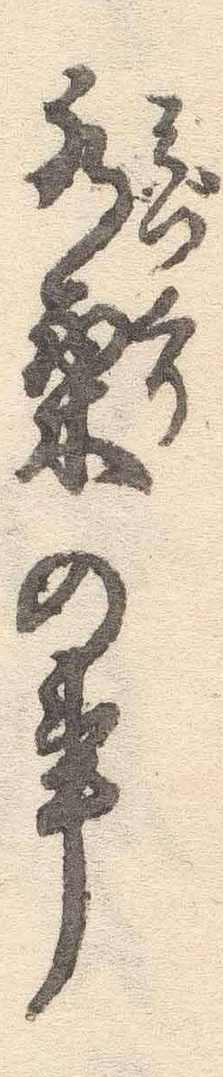水栗の事
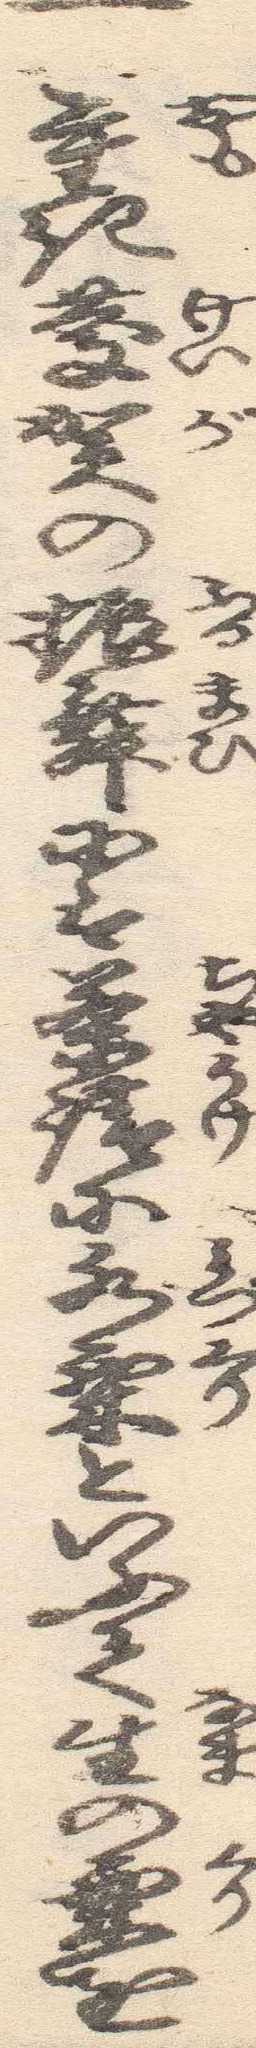一重き慶賀の振舞には茶請に水栗といふて生の栗を
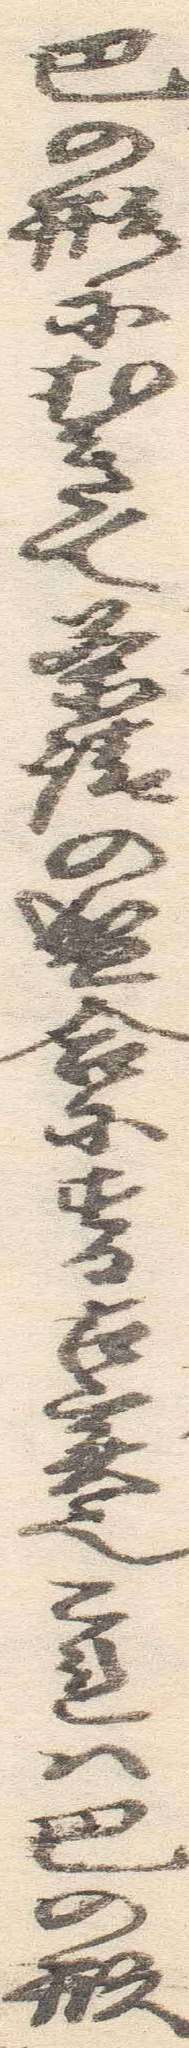巴の形にむきて茶請の盛合にする古実也これは巴の形
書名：料理通
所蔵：東京学芸大学附属図書館 国文学研究資料館
